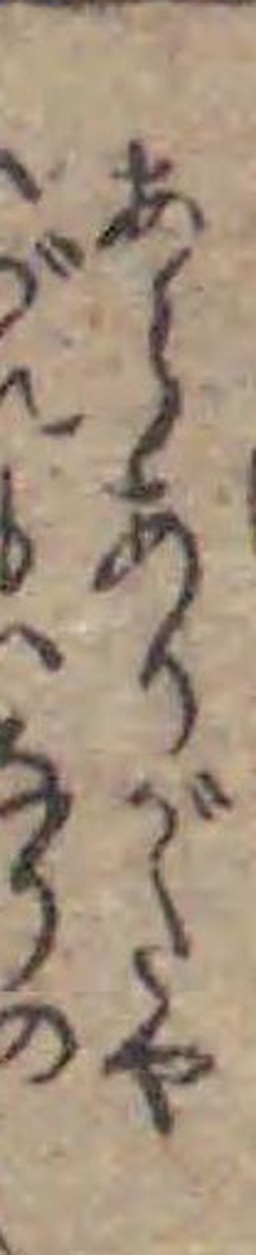いづれもいなりの
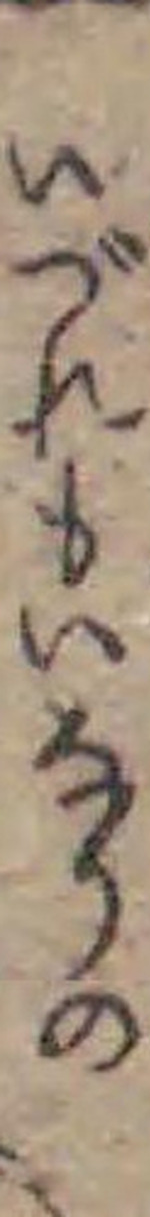いづれもいなりの
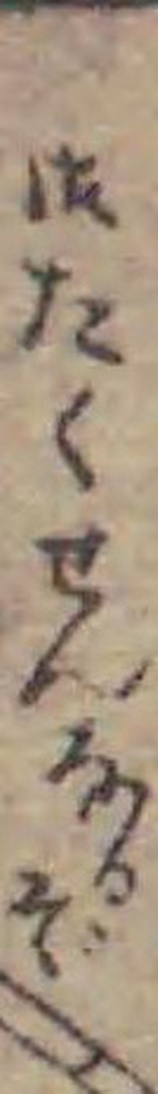御たくせんなるぞ
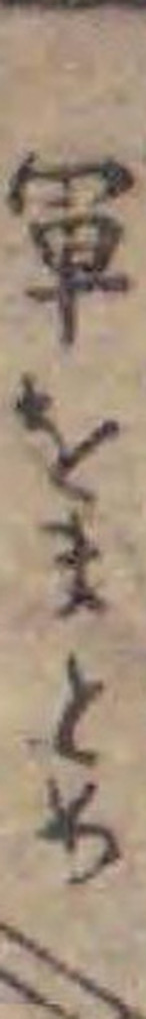軍をまとめ
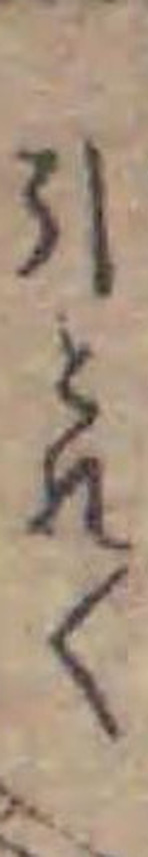引とれ〳〵

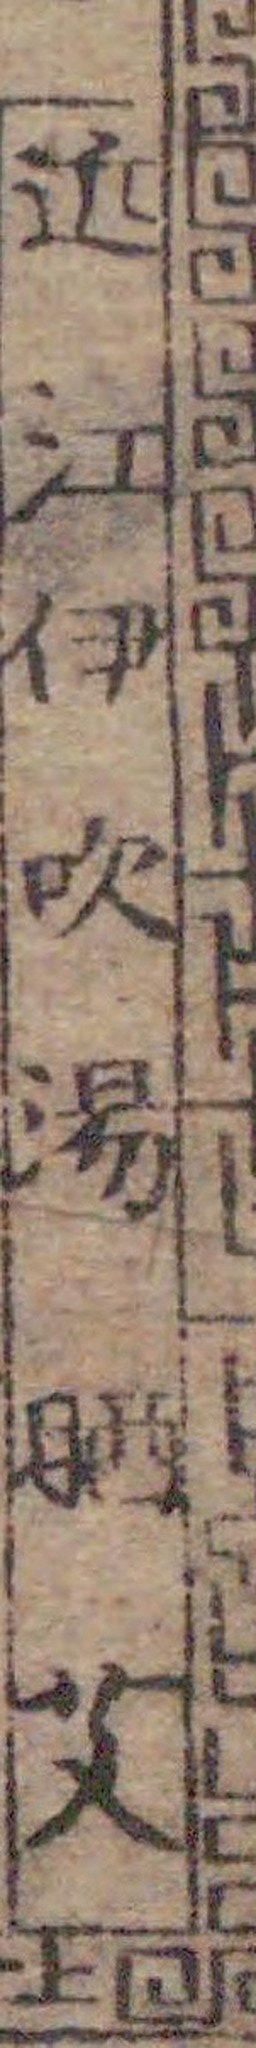近江伊吹晒艾
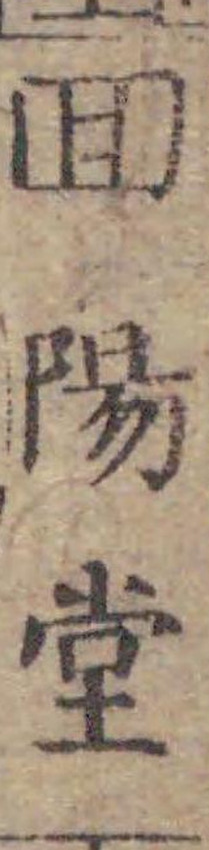回陽堂
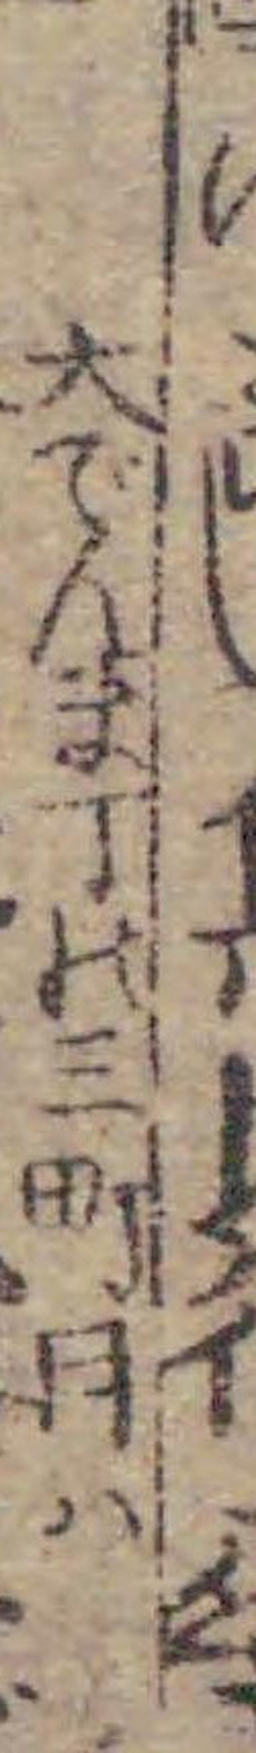大でんま丁の三丁目は
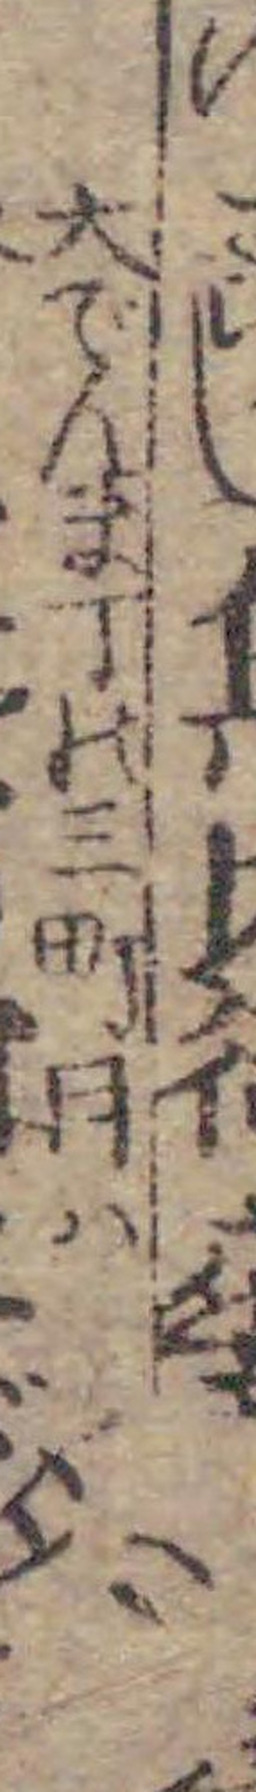大でんま丁の三丁目は
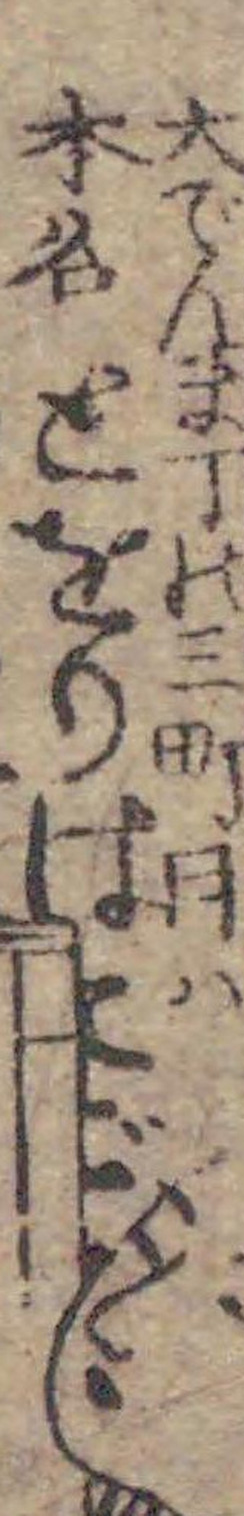本名とをりはたご
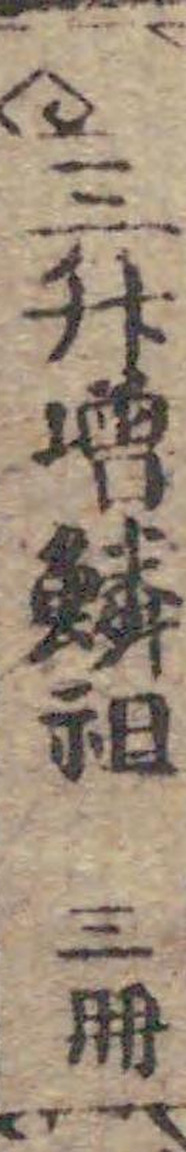三升増鱗祖三冊
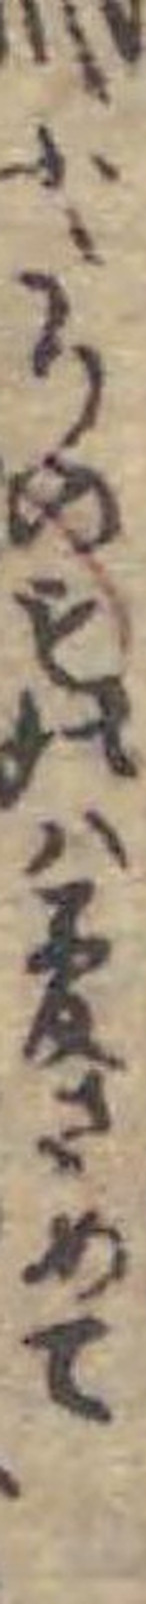ふたりんものは夢さめて
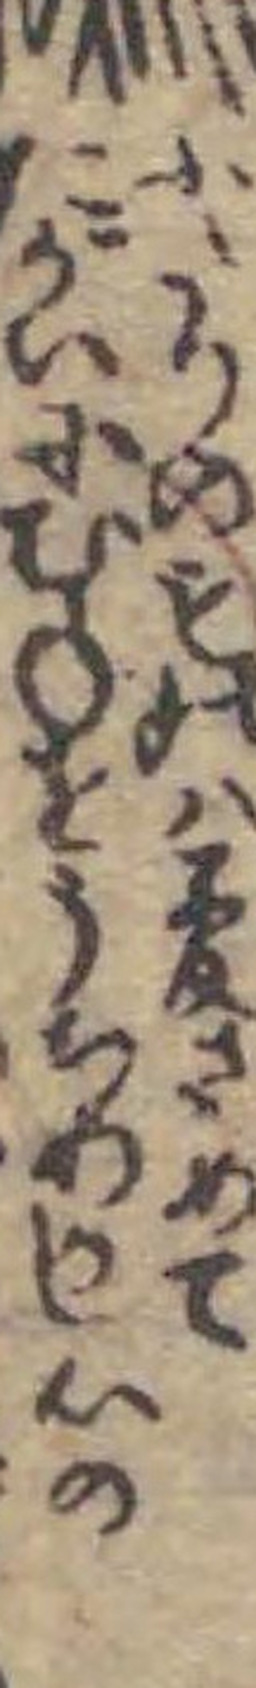たがいにむねをうちあかし心の
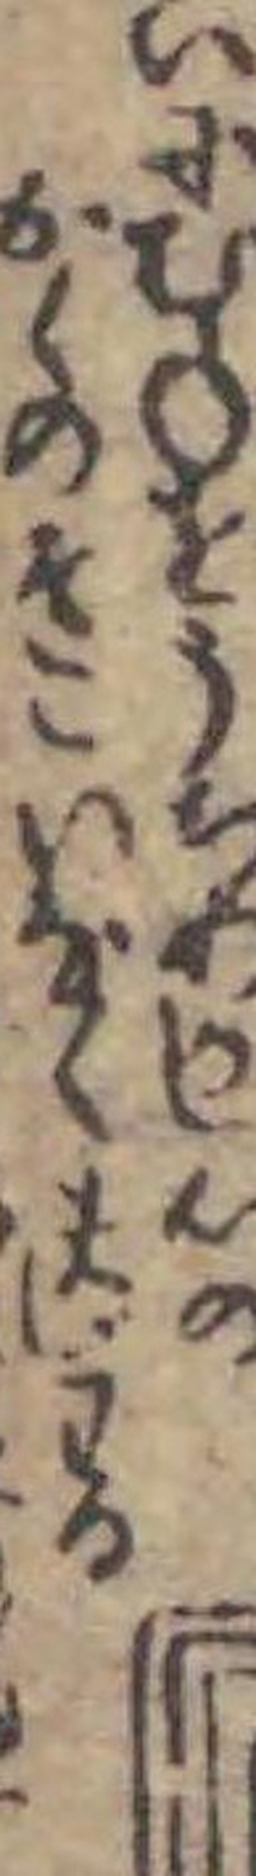おくのそこいなくましわる
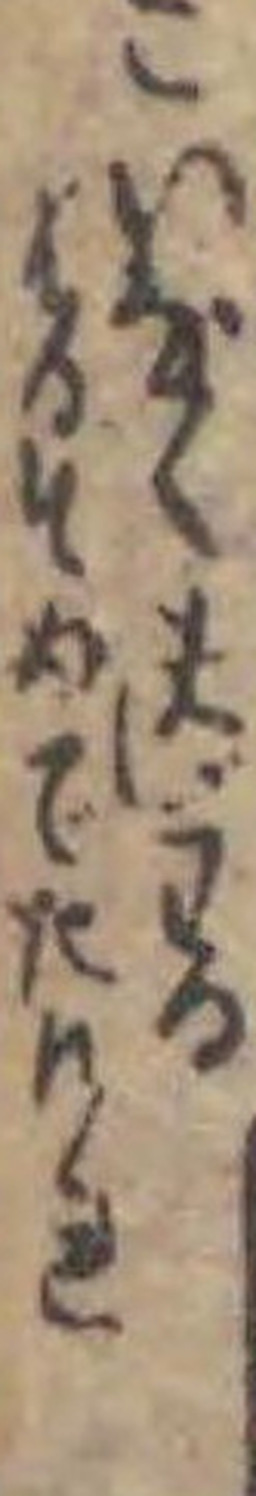はるそめでたけれ
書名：三舛増鱗組 : 3巻
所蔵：国立国会図書館 National Diet Library, JAPAN
